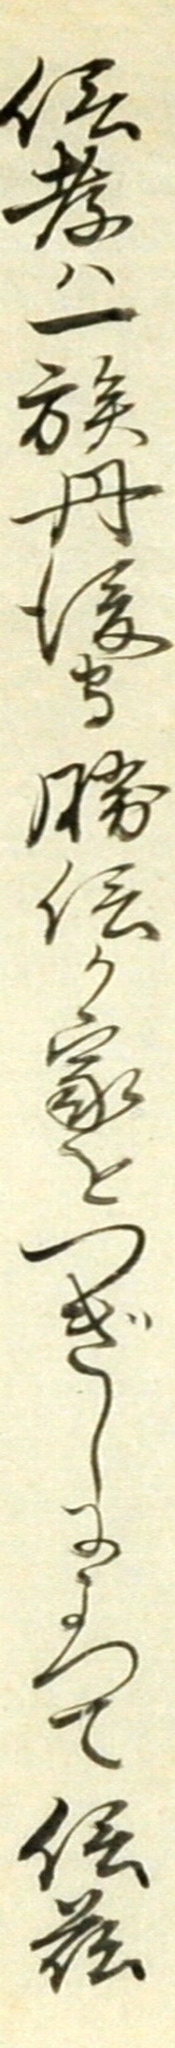信孝は一族丹後守勝信か家をつぎしによつて信茲
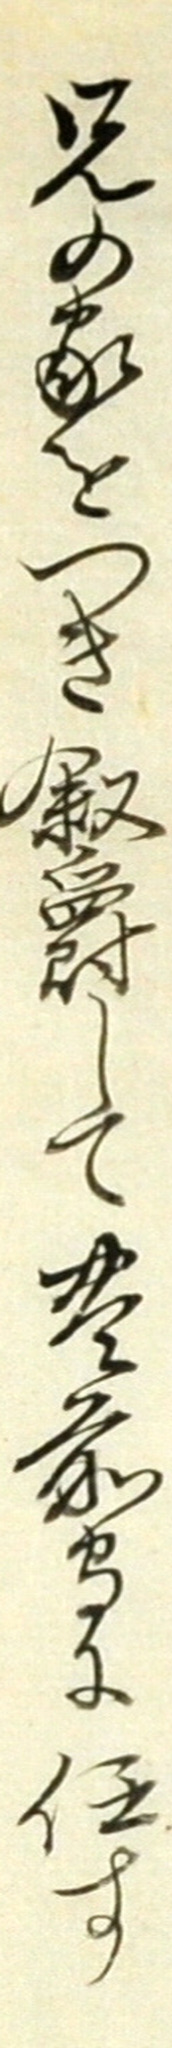兄の家をつき叙爵して豊前守に任す
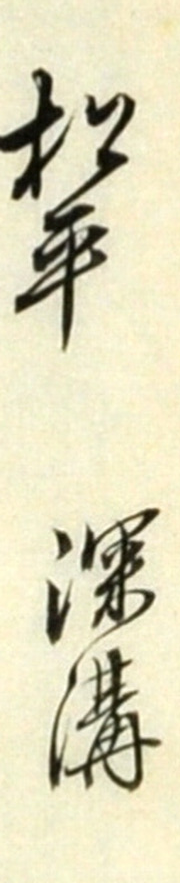松平深溝
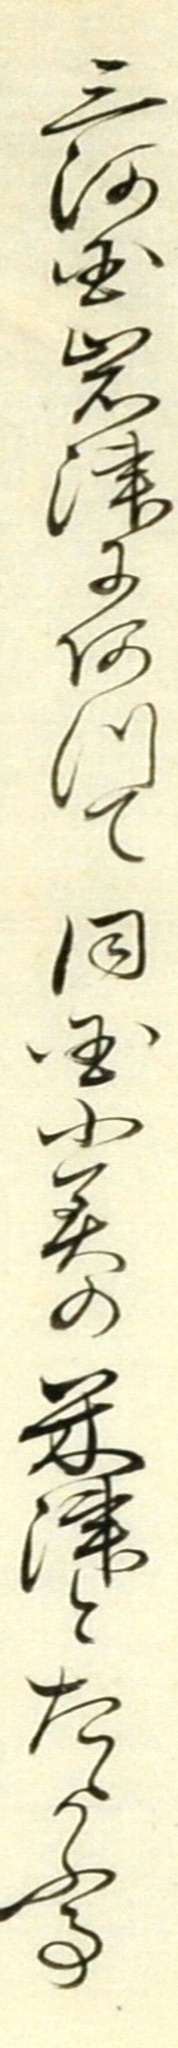三河国岩津にあつて同国小美の米津とたゝかふ事
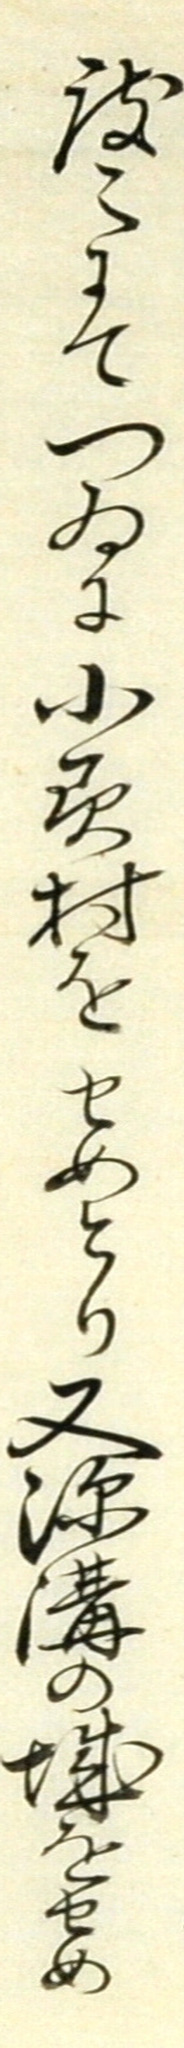度々にてつゐに小美村をせめとり又深溝の城をせめ
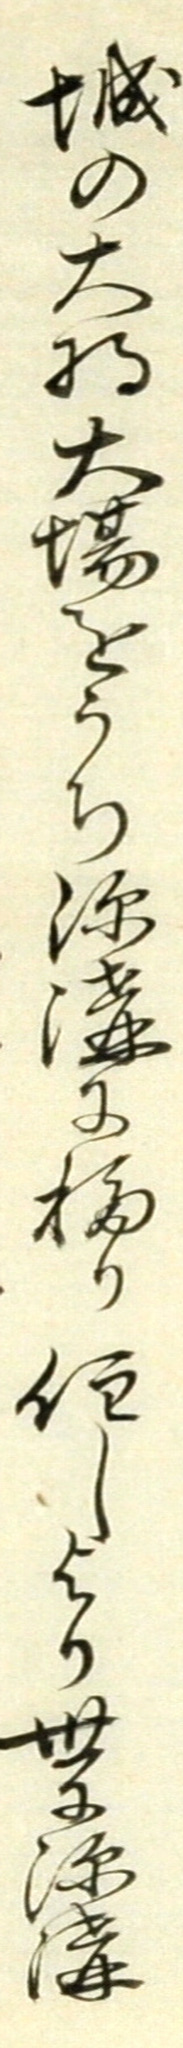城の大将大場をうち深溝に移り住しより世に深溝
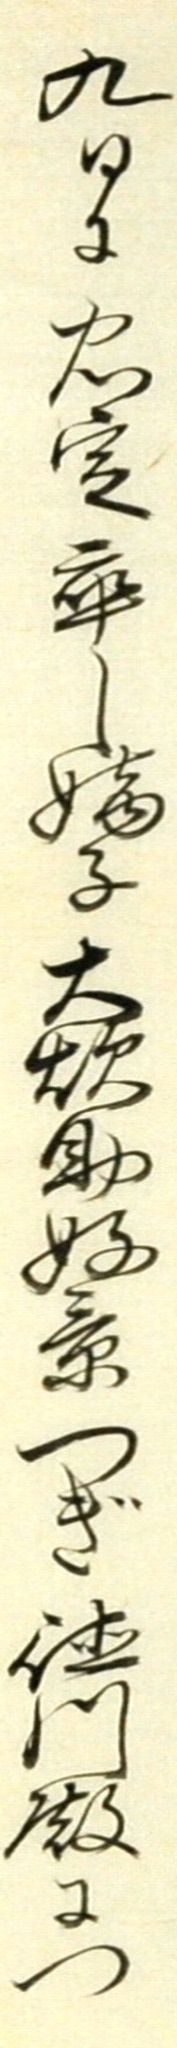九日に忠定卒し嫡子大炊助好景つぎ徳川殿につ
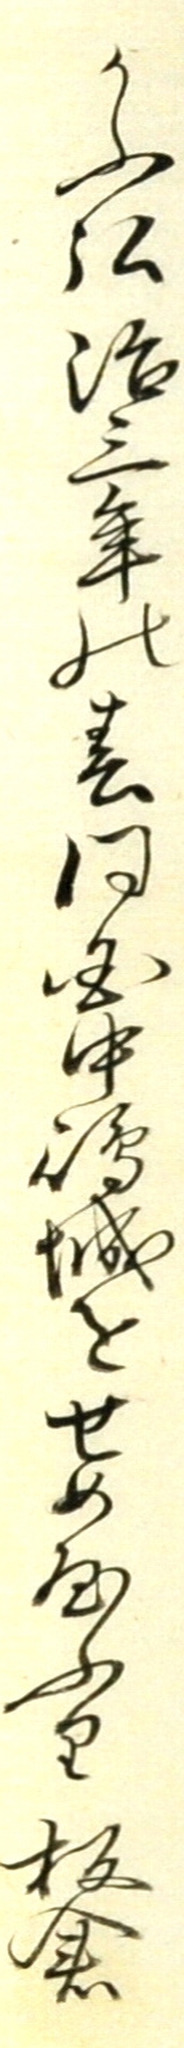かふ弘治三年の春同国中島城をせめやふり板倉

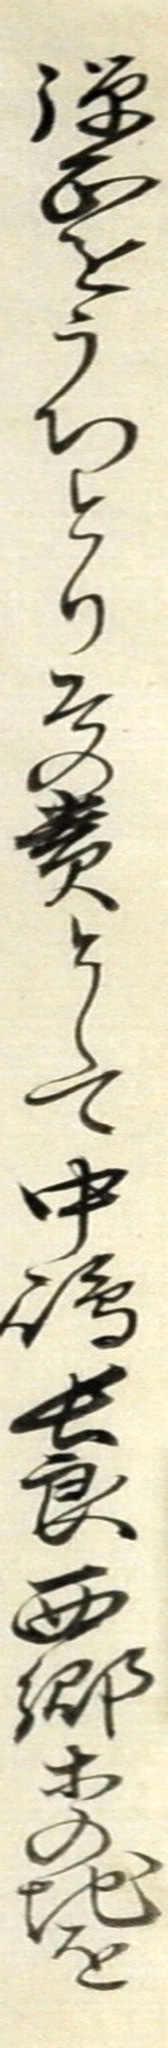弾正をうちとりその賞として中島長良西郷等の地を
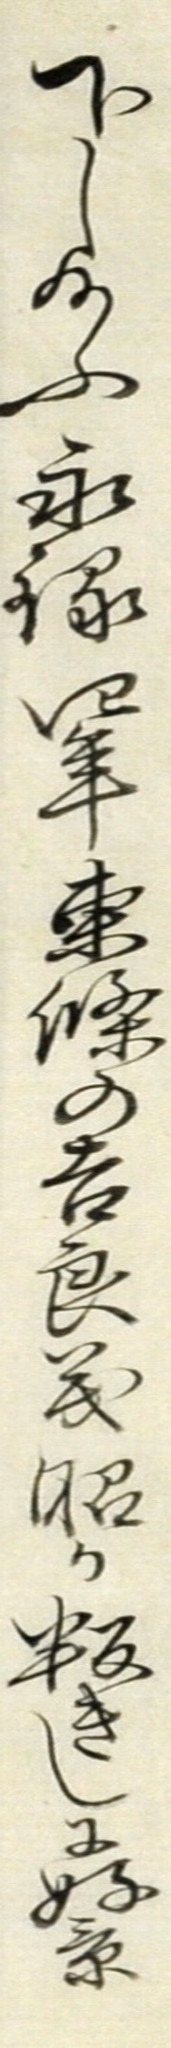下し給ふ永禄四年東条の吉良義昭か叛きしに好景
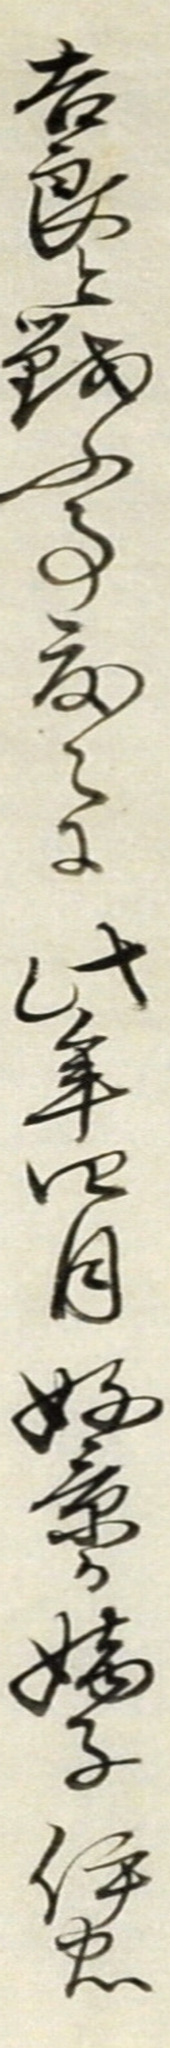吉良と戦ふ事度々に此年四月好景か嫡子伊忠
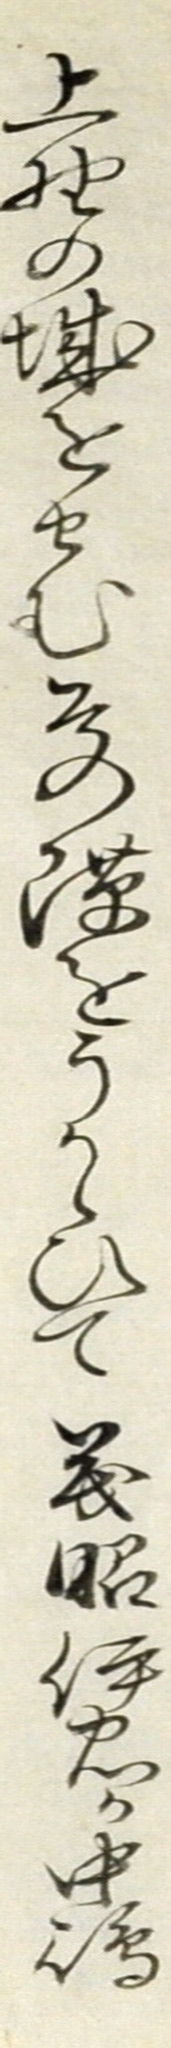上野の城をせむその隙をうかゝひて義昭伊忠か中島
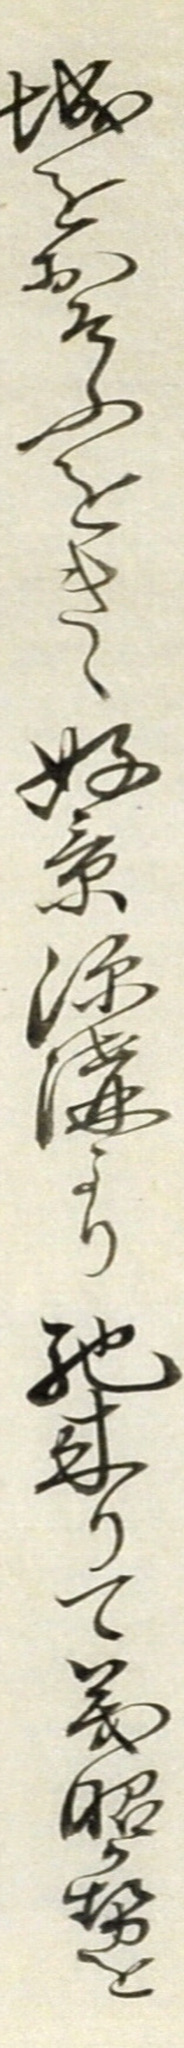城をおそふをきゝ好景深溝より馳来りて義昭か勢を
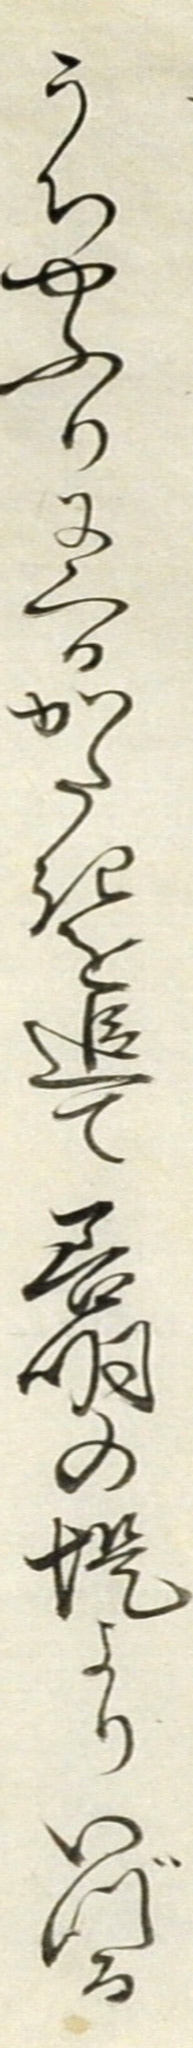うちやふりにくるかたきを追て善明の堤よりいづる
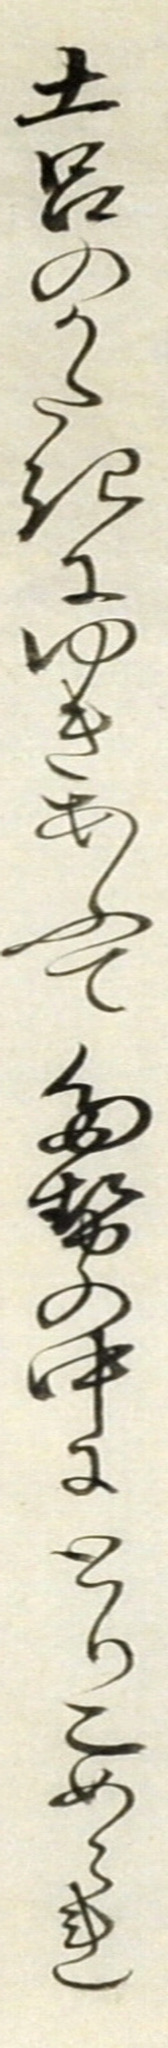土呂のかたきにゆきあふて多勢の中にとりこめられ
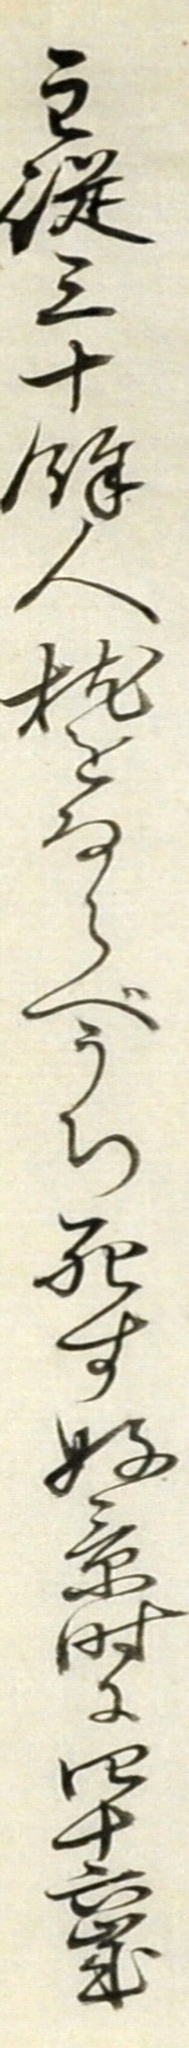主従三十余人枕をならべうち死す好景時に四十六歳
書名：藩翰譜（二・三）
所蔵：伊那市立高遠町図書館・合同会社AMANE
